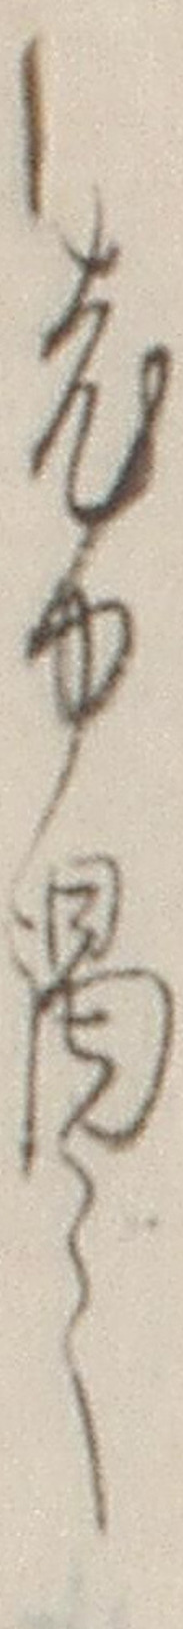老中謁之
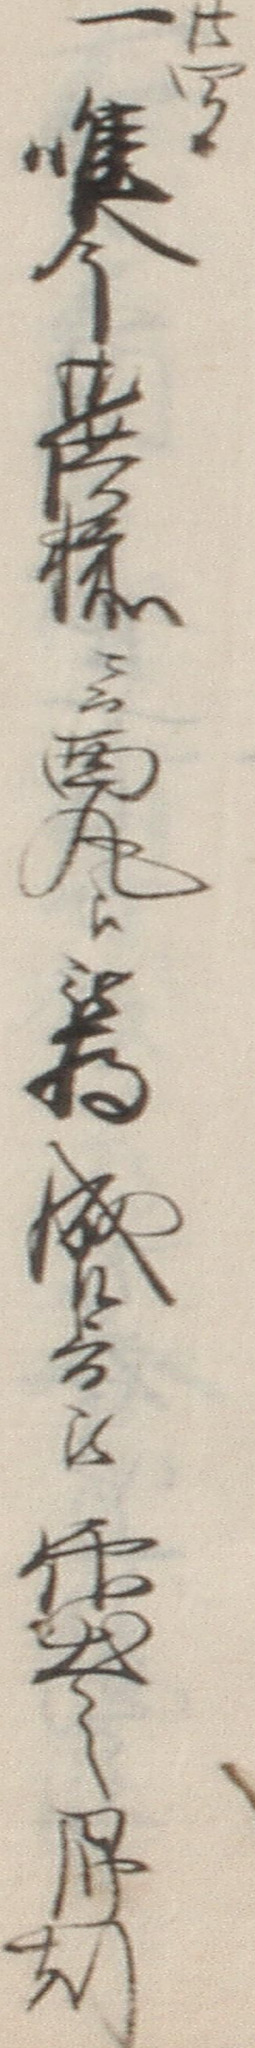一唯今御供様ニ而西丸え被為成候旨被仰出之帰刻
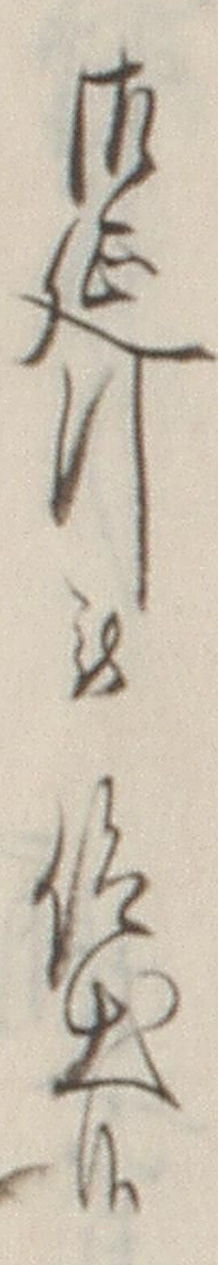御延引被仰出候
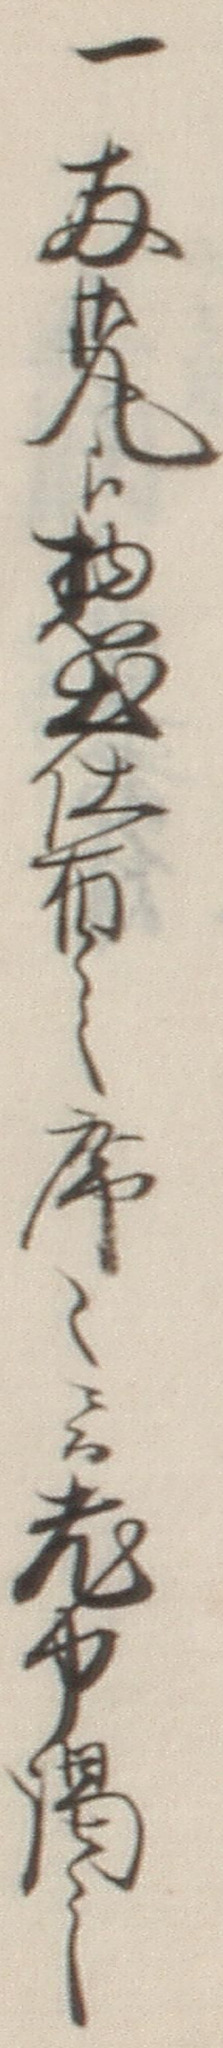一両御丸え惣出仕有之席々ニ而老中謁之
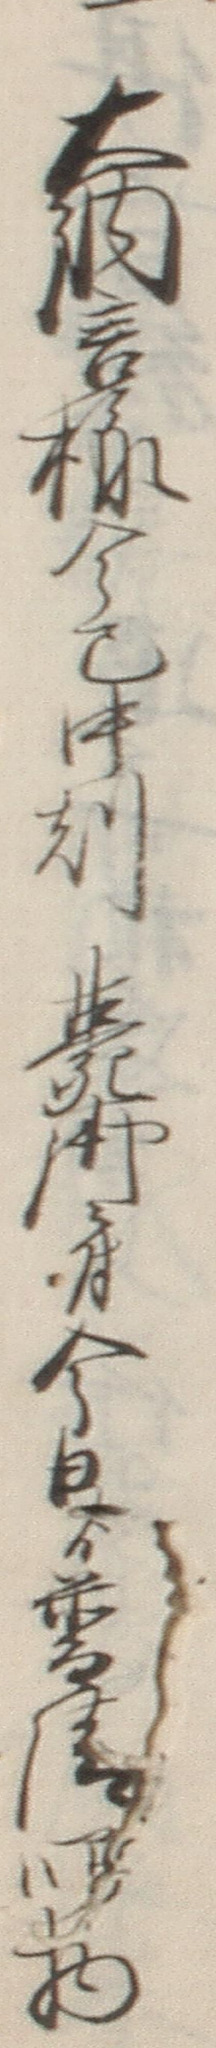一大納言様今己申刻薨御ニ付今日ゟ普請鳴物

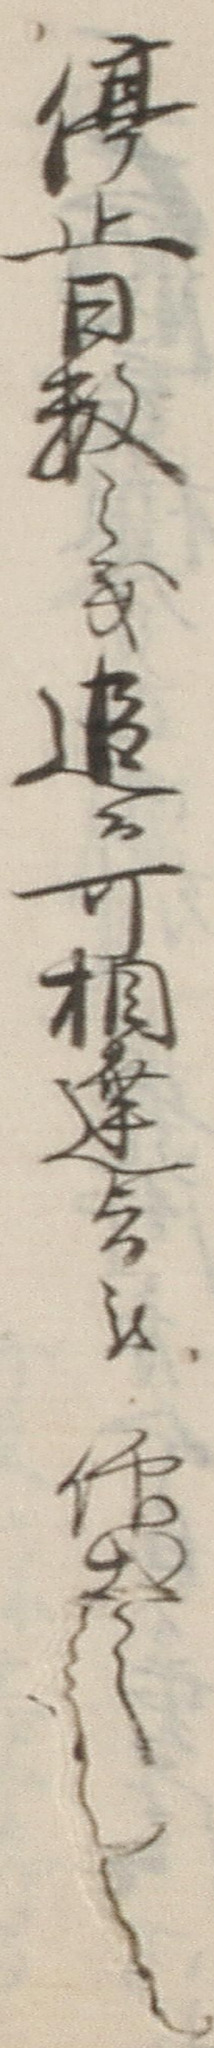停止日数之義追而可相達旨被仰出候
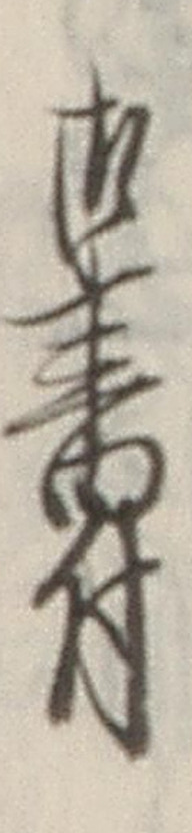御書付
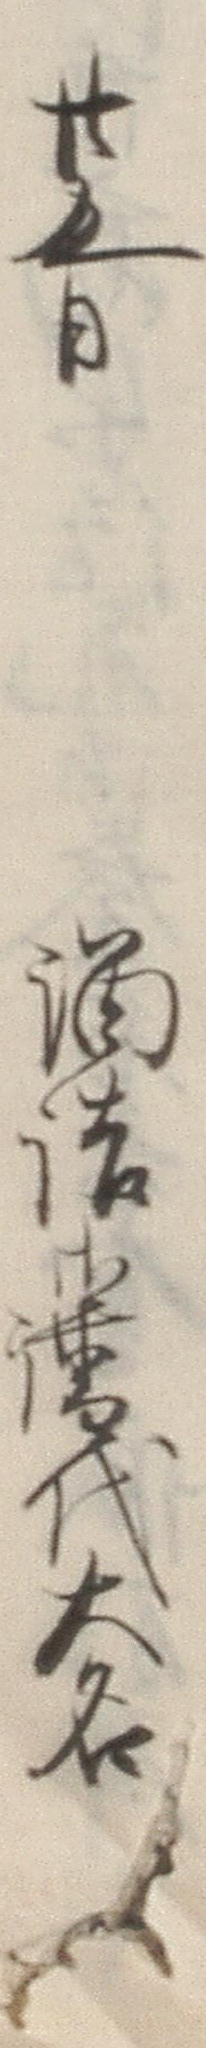廿九日溜詰御譜代大名
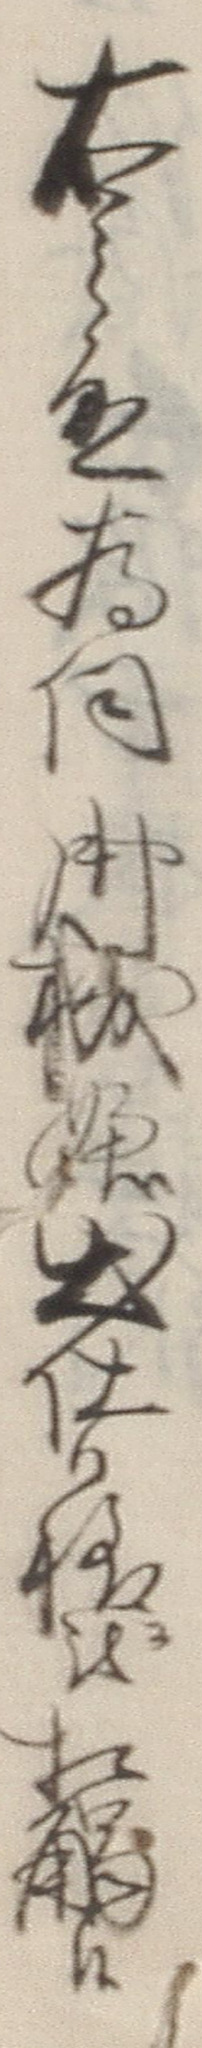右之通為伺御機嫌出仕候様被相触候
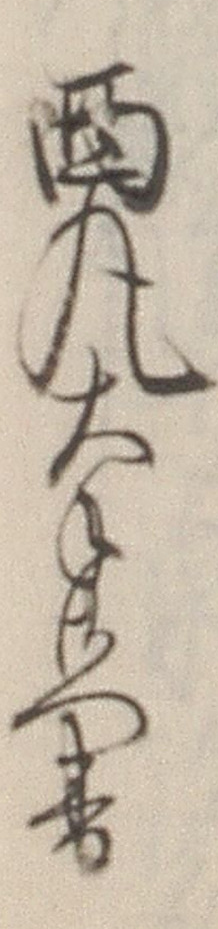西丸大手御門番
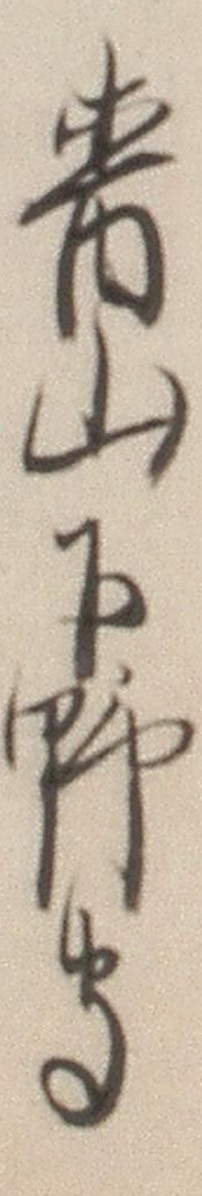青山下野守
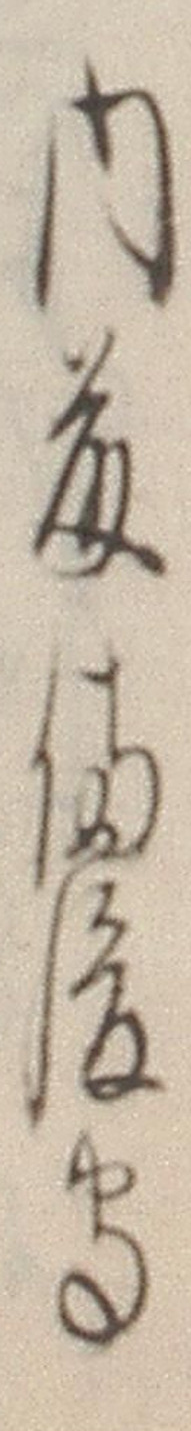内藤備後守
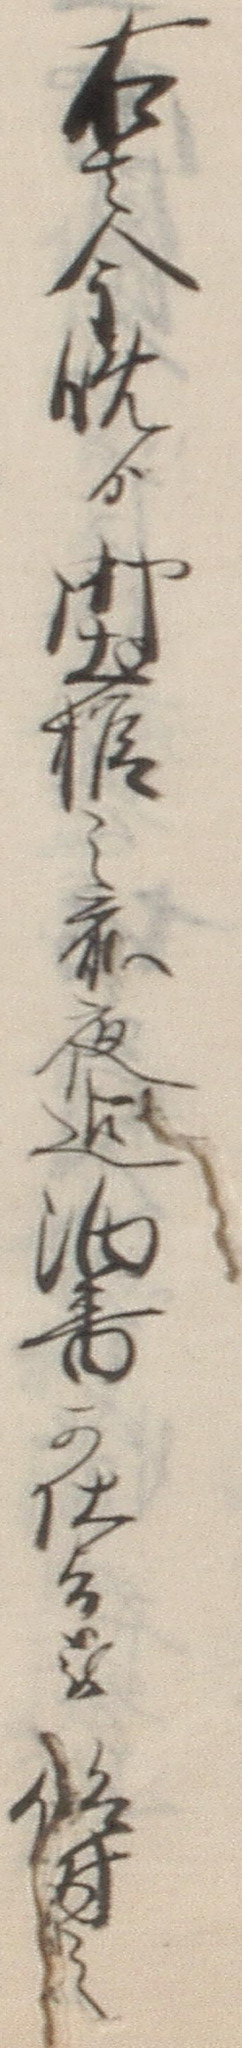右は今晩ゟ御出棺之前夜迄泊番可仕旨被仰付候
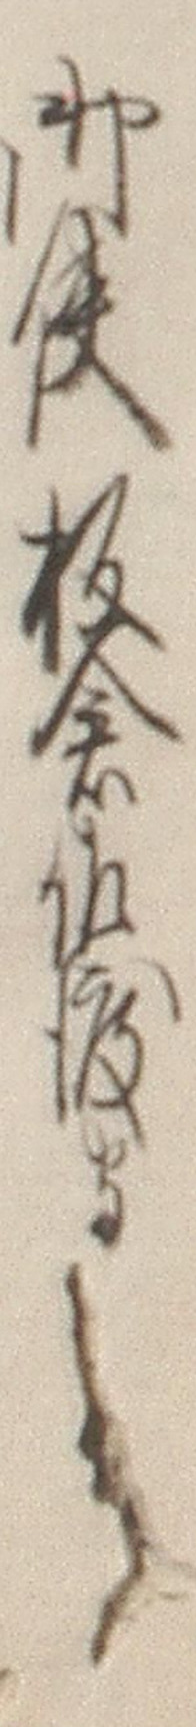御使板倉佐渡守
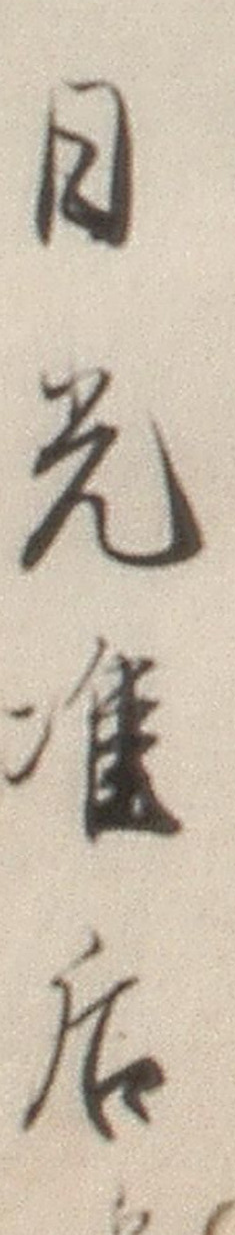日光准后
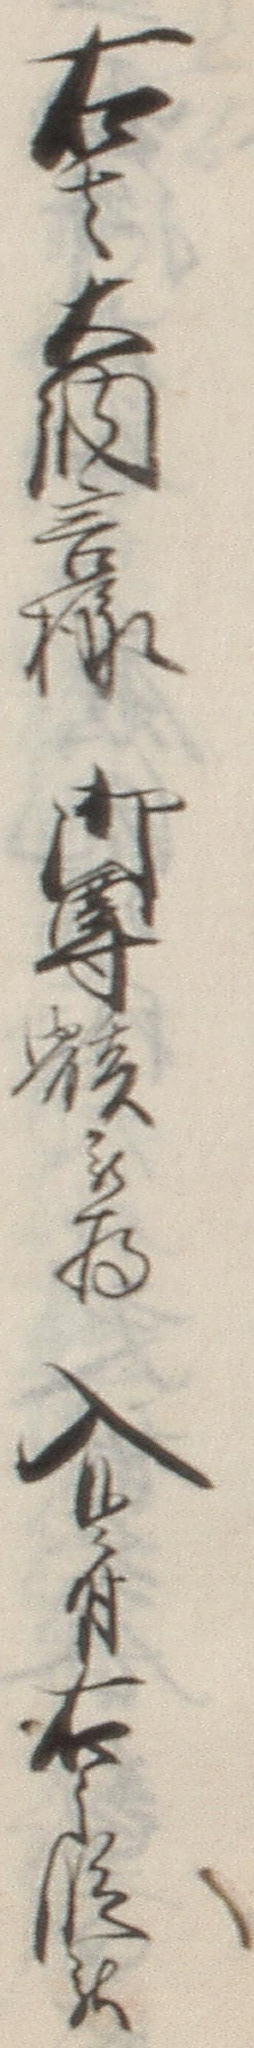右は大納言様御尊骸被為入候ニ付右之段被
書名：[諸国災害記録]
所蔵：東京大学地震研究所図書室 Earthquake Research Institute Library, The University of Tokyo, JAPAN
